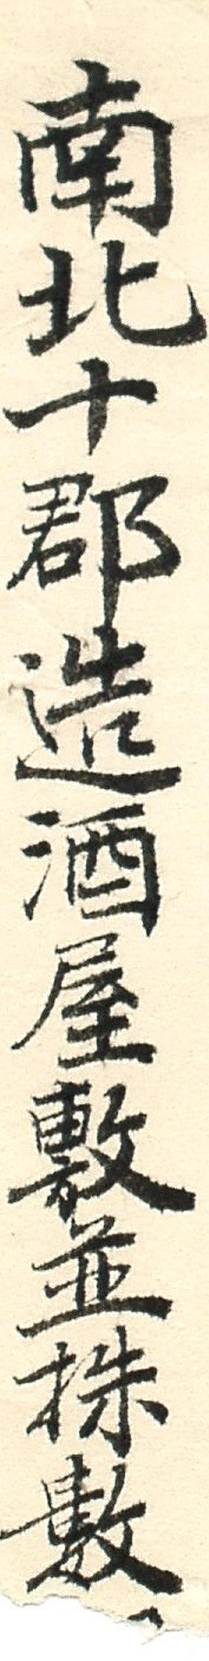南北十郡造酒屋敷並株数
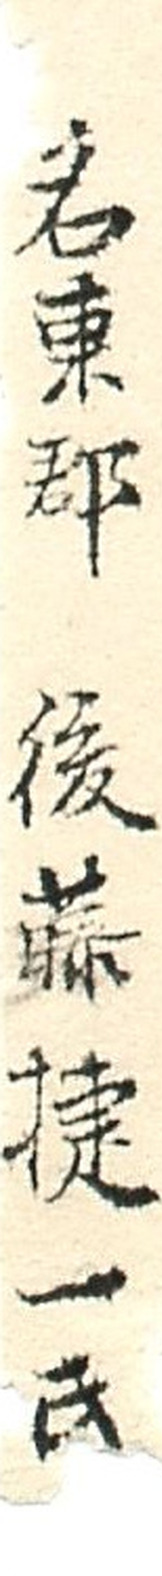名東郡後藤捷一氏

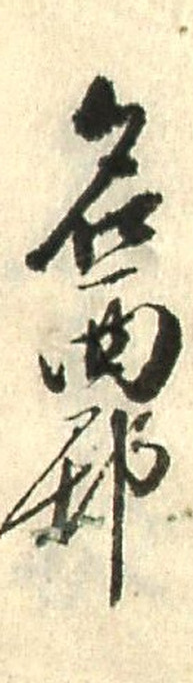名西郡
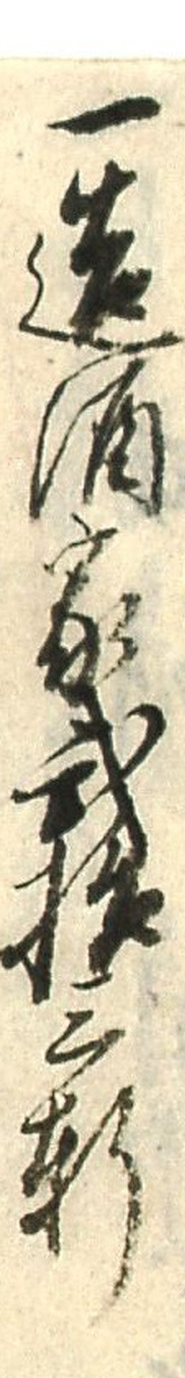一造酒家弐拾二軒
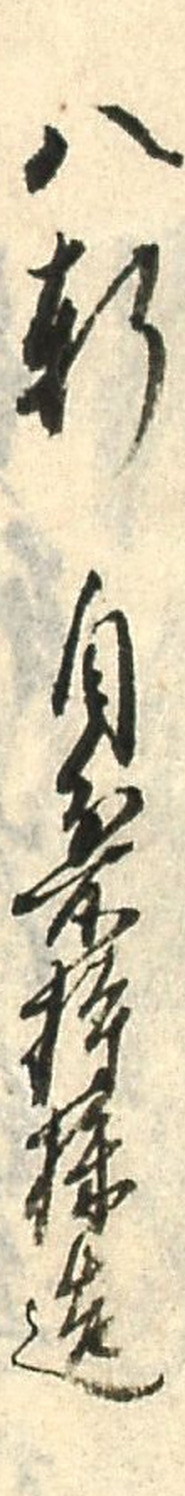八軒自分所持株造
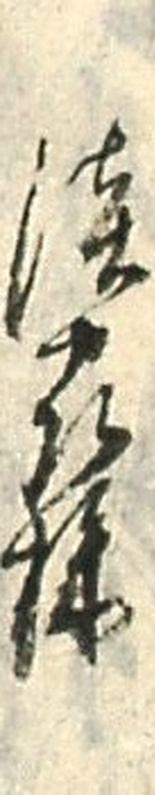淡州様
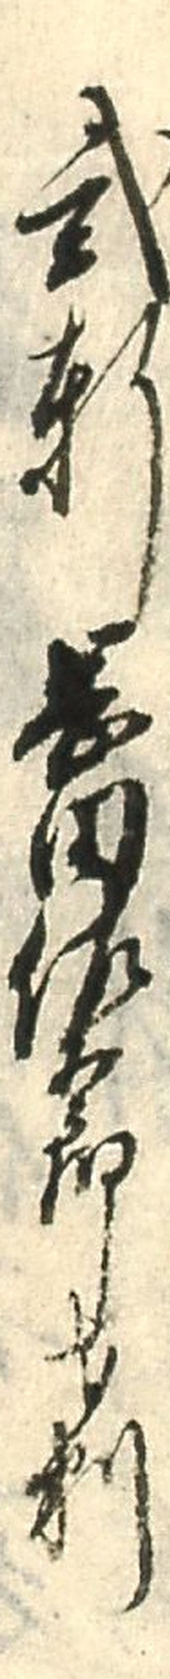弐軒岡田佐五郎才判
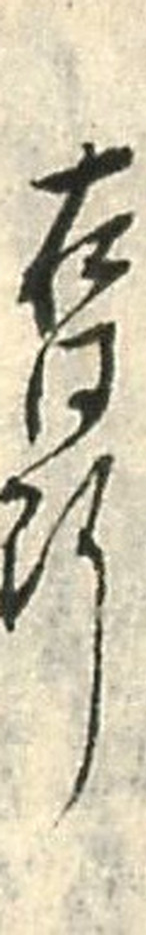右同断
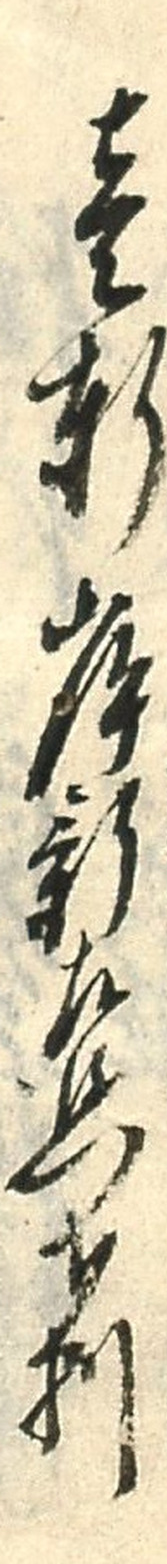壱軒岸新左衛門才判
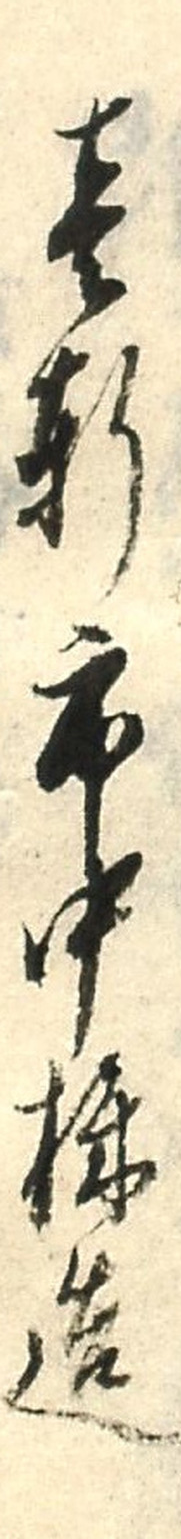壱軒市中株造
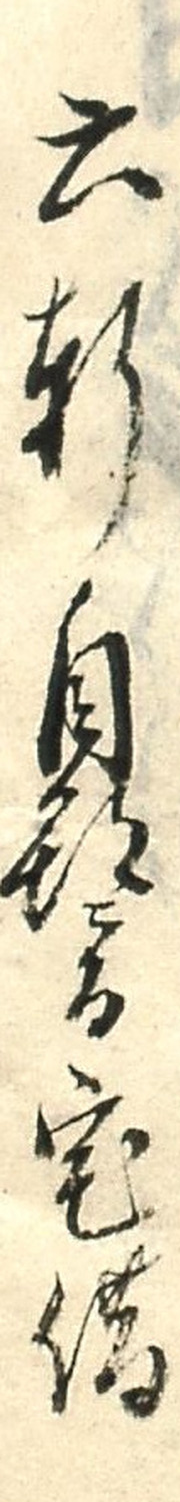六軒自郡に而宅借
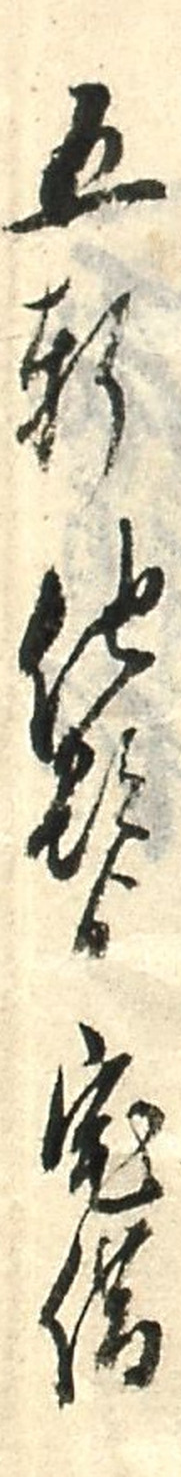五軒他郡ゟ宅借
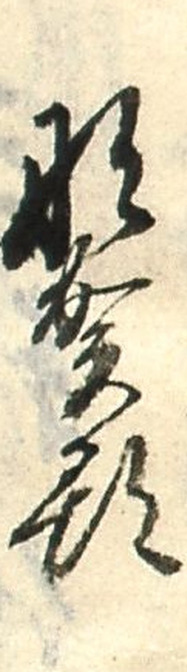那賀郡
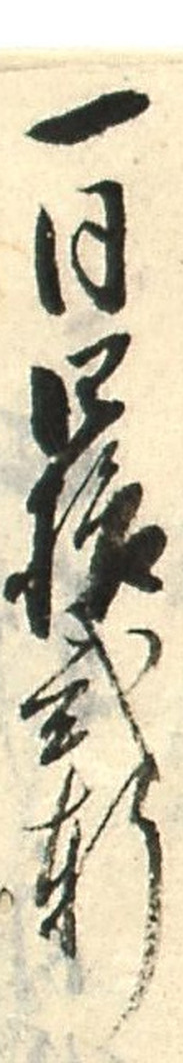一同四拾弐軒
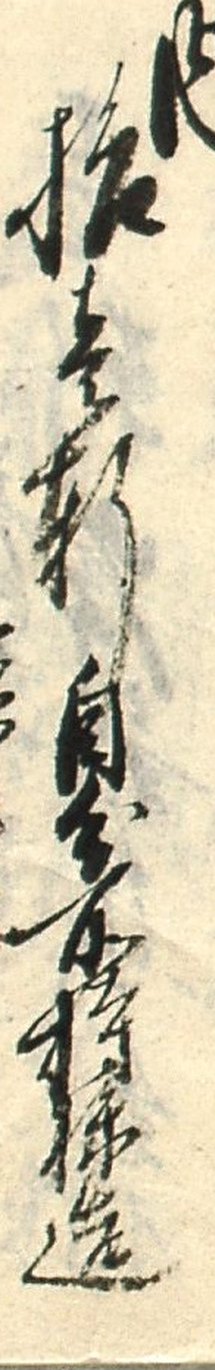拾壱軒自分所持株造
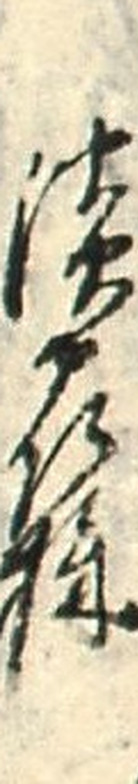淡州様
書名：南北拾郡造酒屋数並株数調子帳
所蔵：鳴門教育大学 Naruto University of Education
